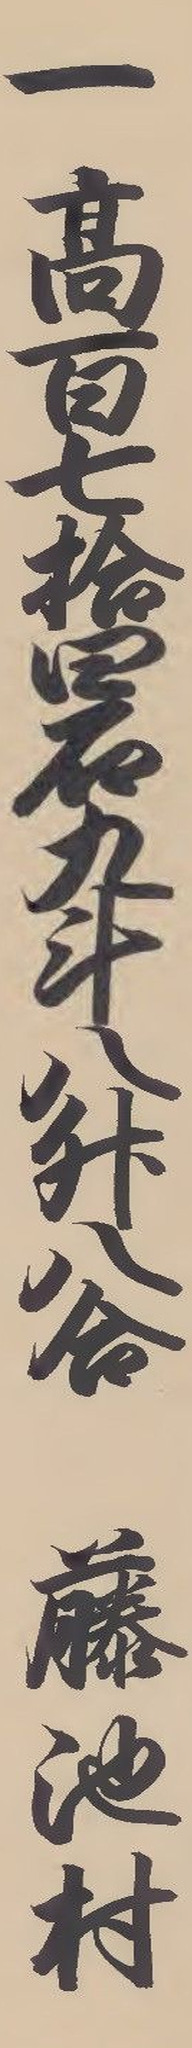一高百七拾四石九斗八升八合藤池村
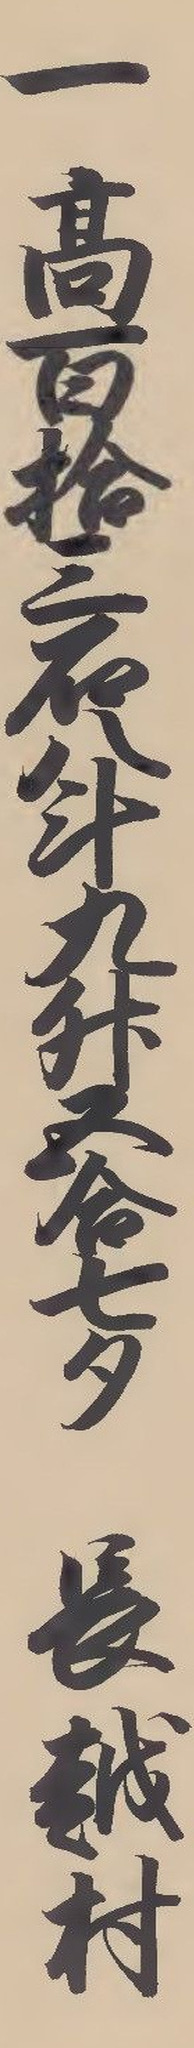一高百拾三石八斗九升五合七勺長越村
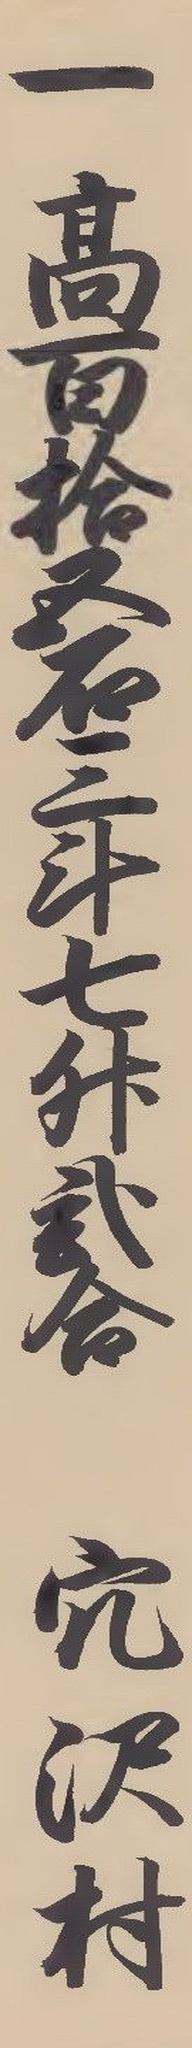一高百拾五石三斗七升弐合穴沢村
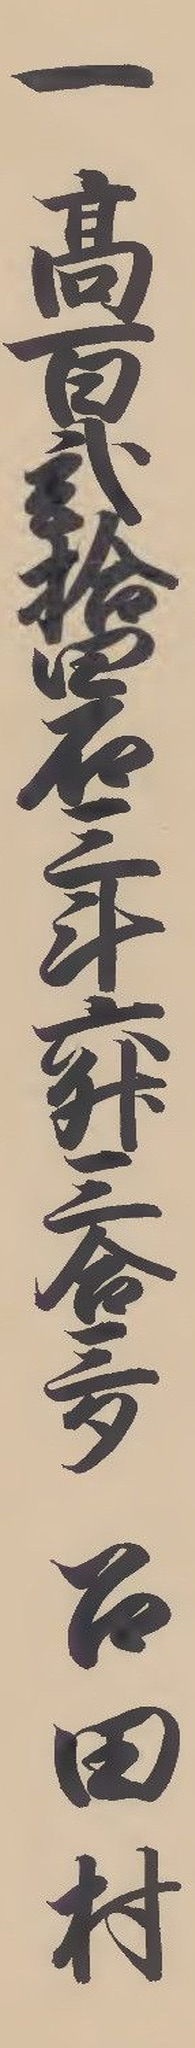一高百弐拾四石三斗六三合三勺召田村

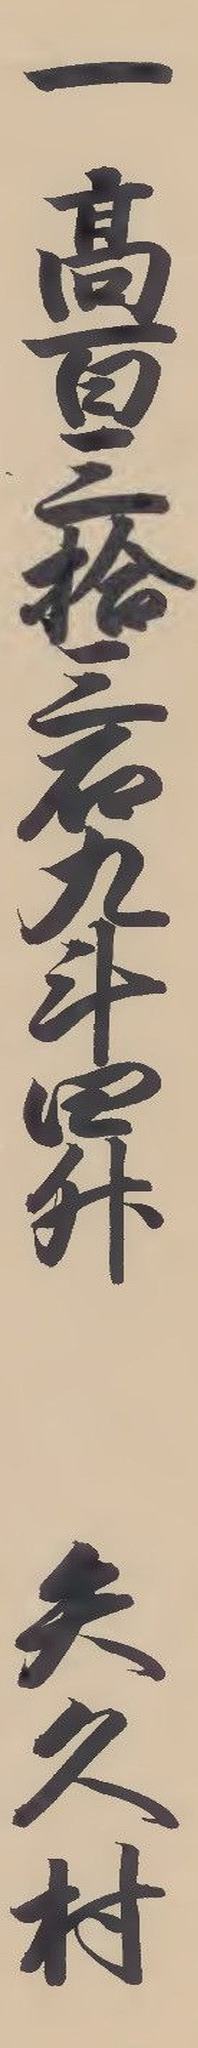一高百三拾三石九斗四升矢久村
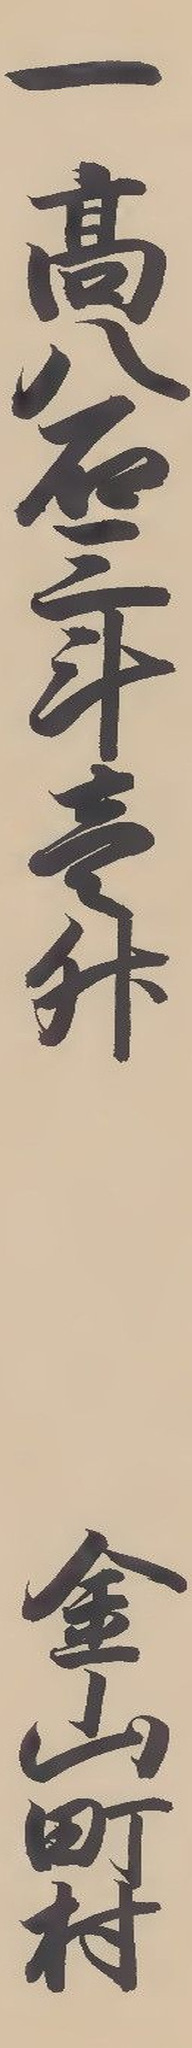一高八石三斗壱升金山町村
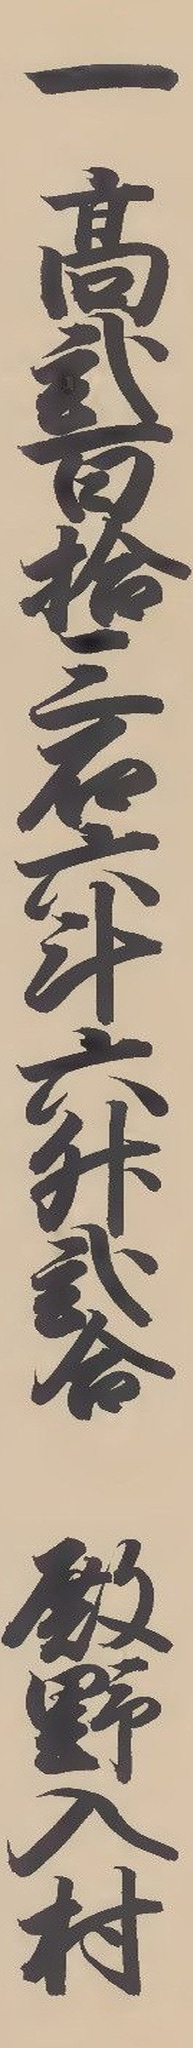一高弐百拾三石六斗六升弐合殿野入村
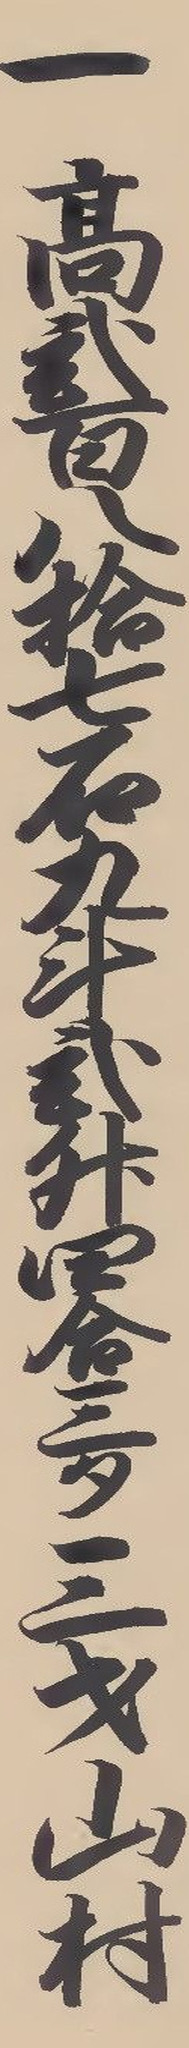一高弐百八拾七石九斗弐升四合三勺三才山村
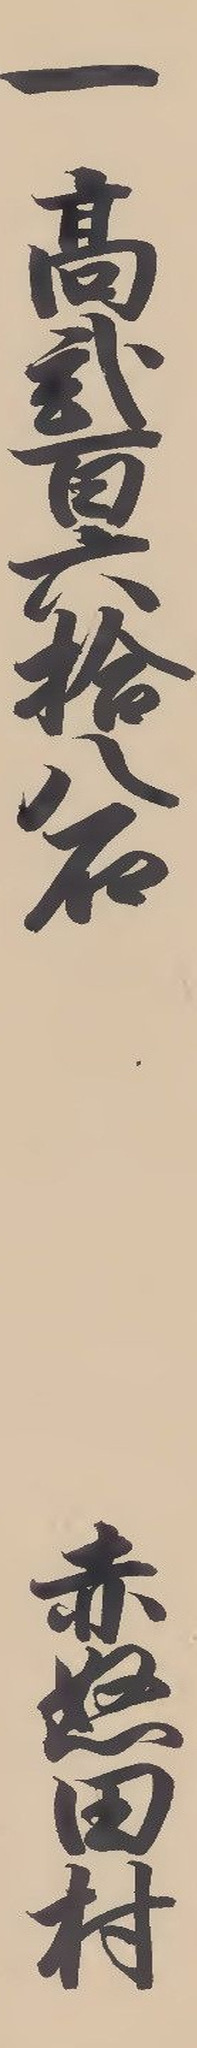一高弐百六拾八石赤怒田村
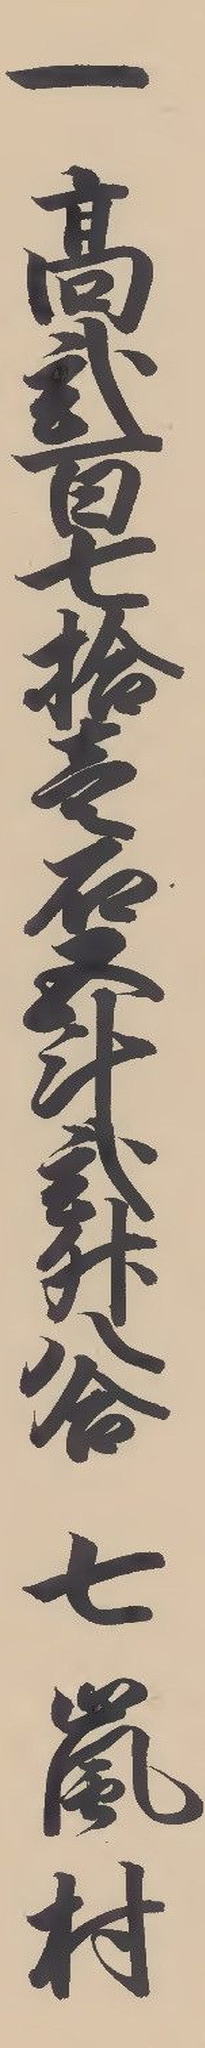一高弐百七拾壱石五斗弐升八合七嵐村

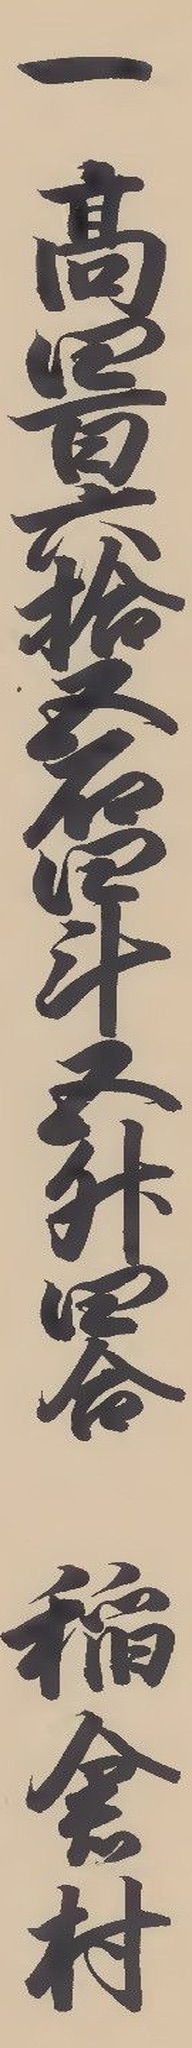一高四百六拾五石四斗五升四合稲倉村
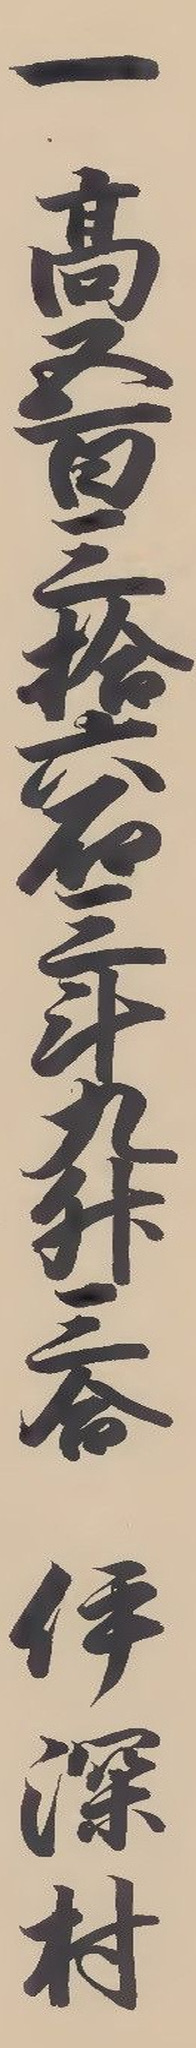一高五百三拾六石三斗九升三合伊深村
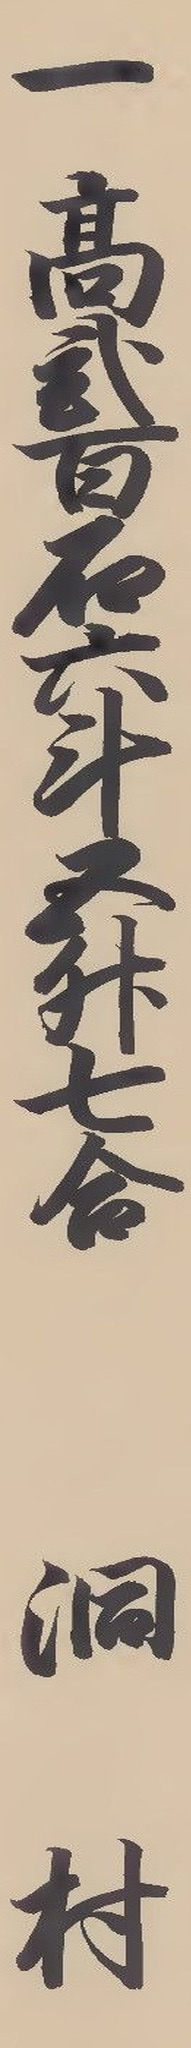一高弐百石六斗五升七合洞村
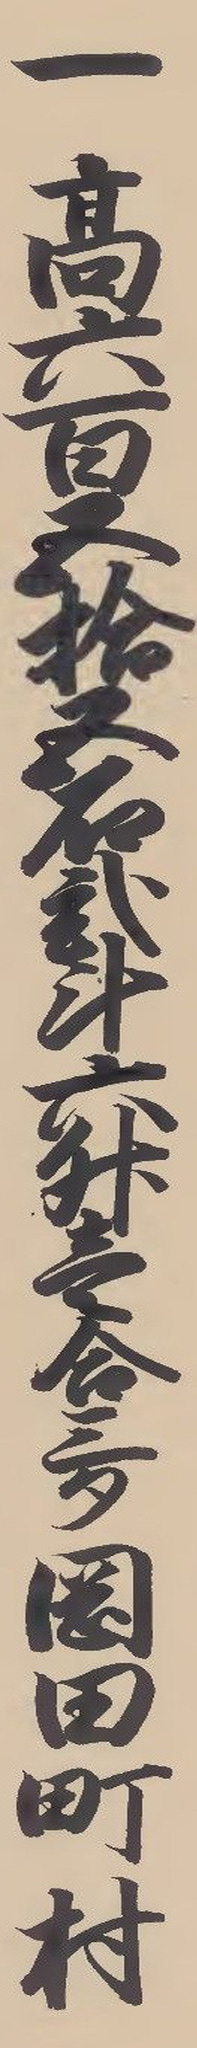一高六百五拾五石弐斗六升壱合三勺岡田町村
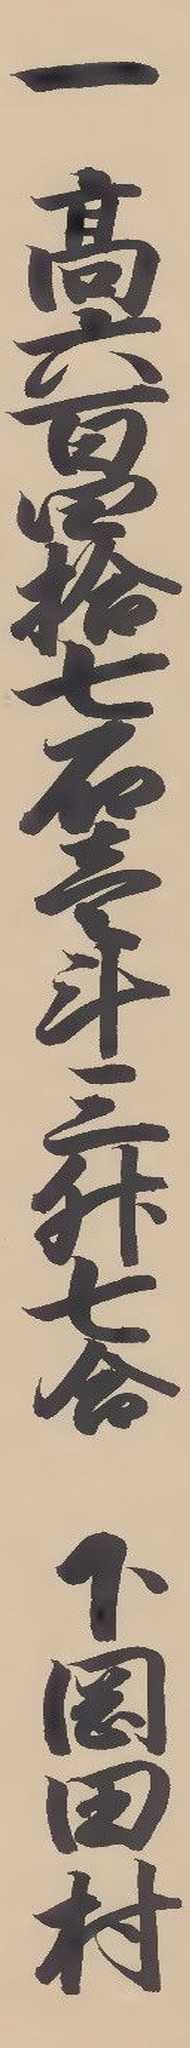一高六百四拾七石壱斗三升七合下岡田村
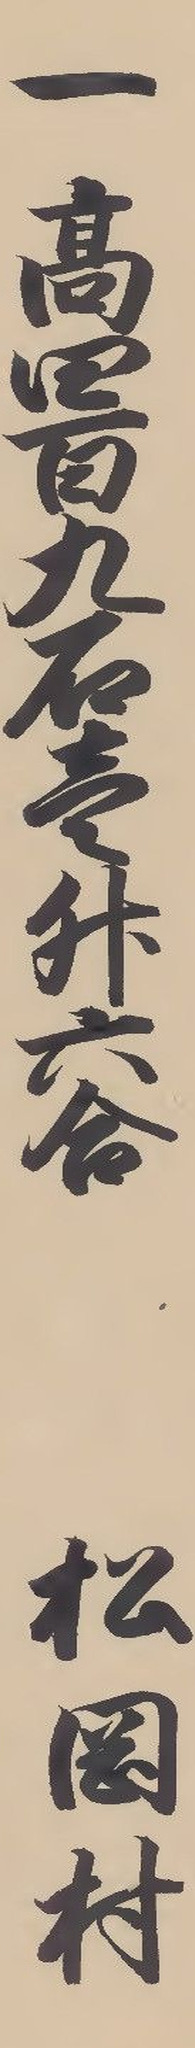一高四百九石壱升六合松岡村
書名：信濃国郷帳
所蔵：国立公文書館 National Archives of Japan
